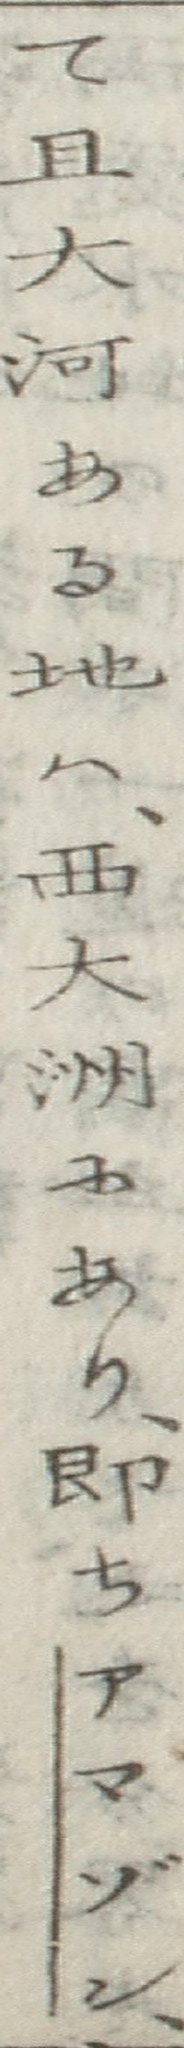て且大河ある地は、西大洲にあり、即ちアマゾン、
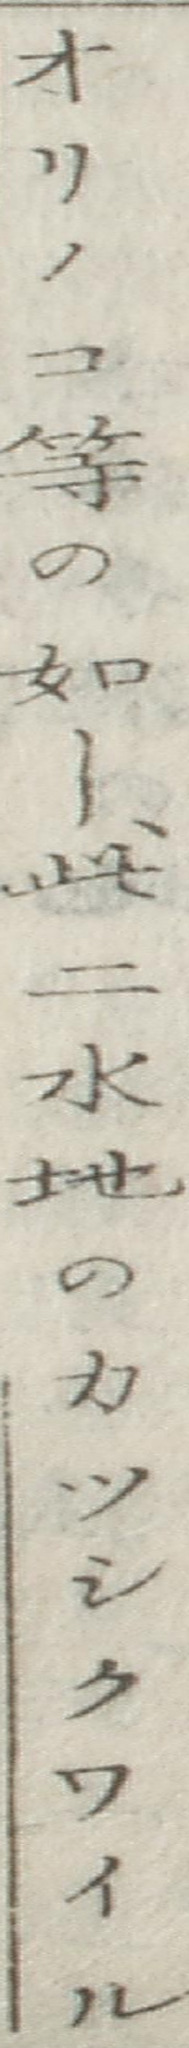オリノコ等の如し、此二水地のカツシクワイル
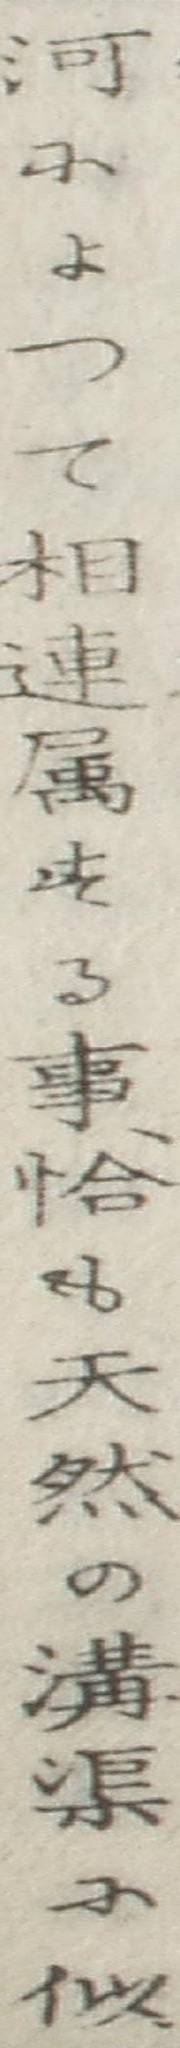河によつて相連属する事、恰も天然の溝渠に似

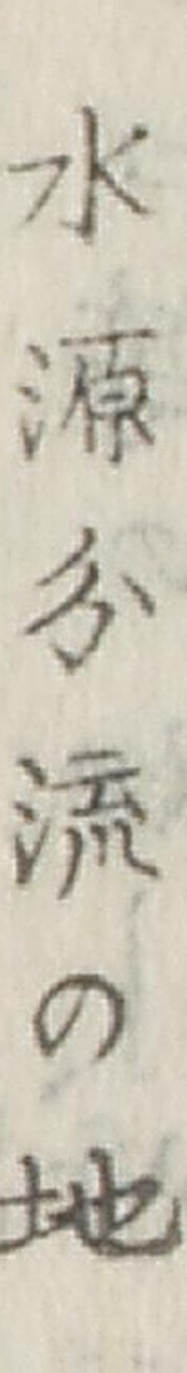水源分流の地
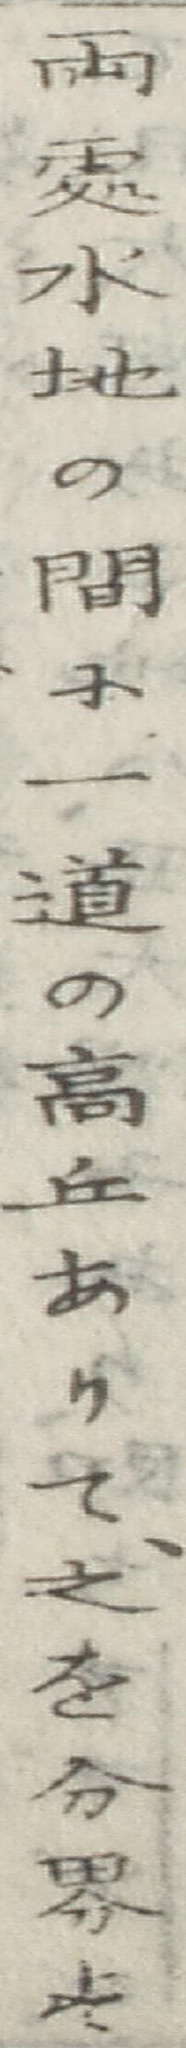両處水地の間に一道の高丘ありて、之を分界す
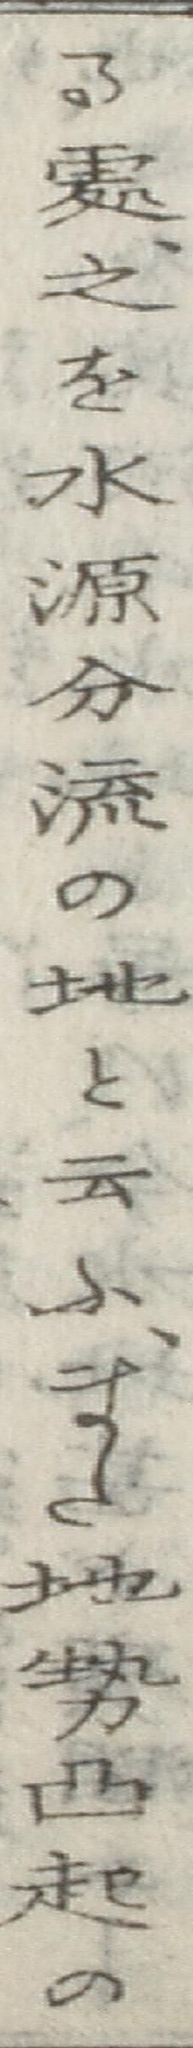る處、之を水源分流の地と云ふ、また地勢凸起の
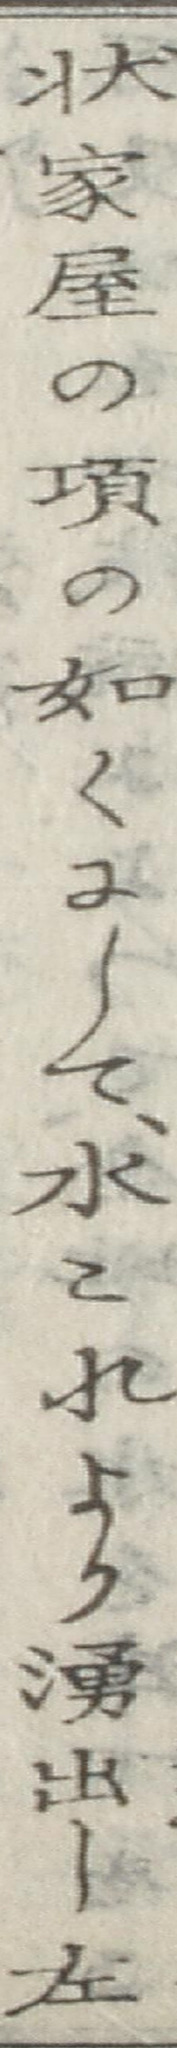状家屋の項の如くにして、水これより湧出し左
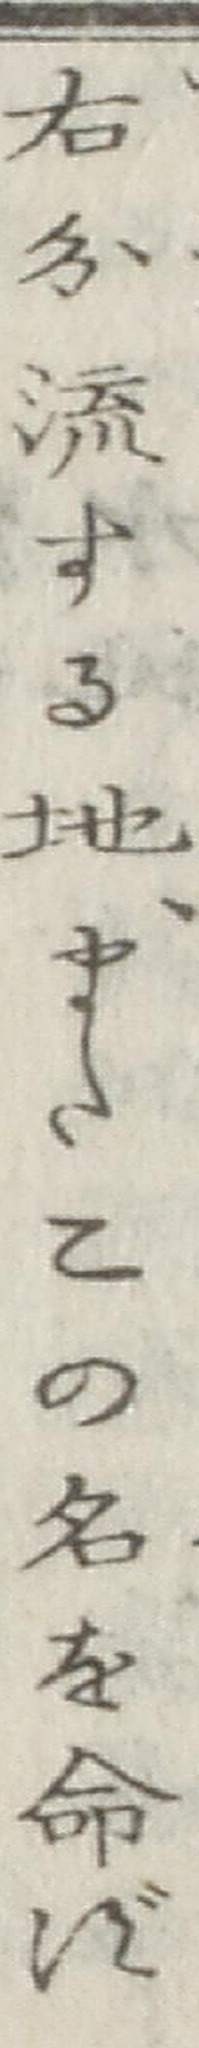右分流する地、またこの名を命ず
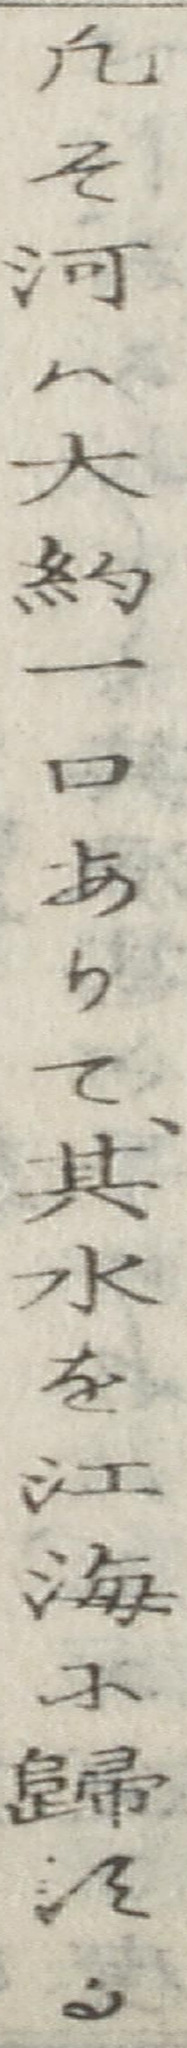凡河は大約一口ありて、其水を江海に帰する
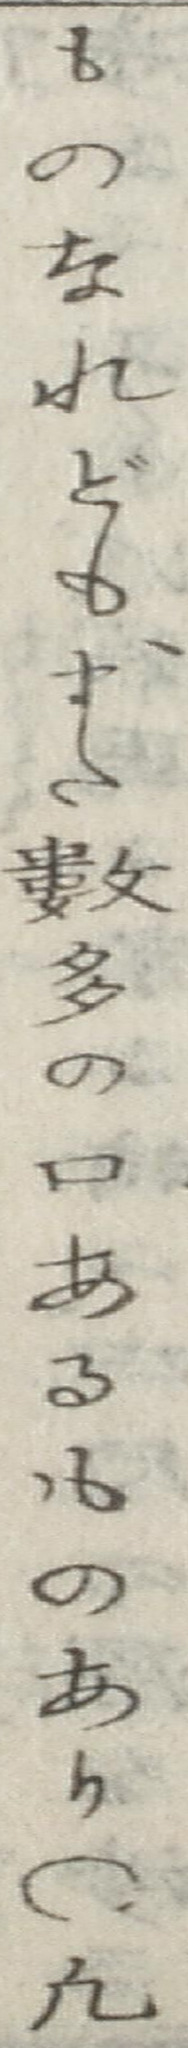ものなれども、また数多の口あるものあり〇凡
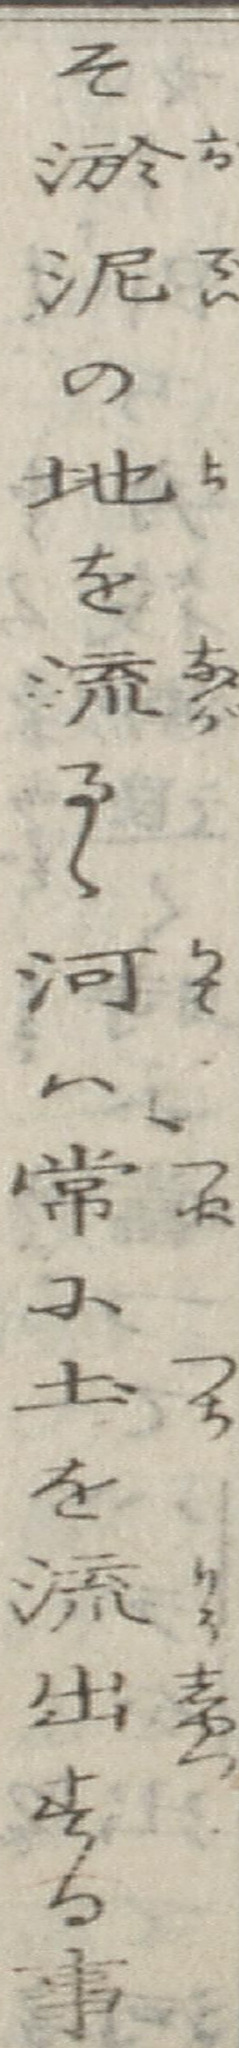そ淤泥の地を流るゝ河は、常に土を流出する事
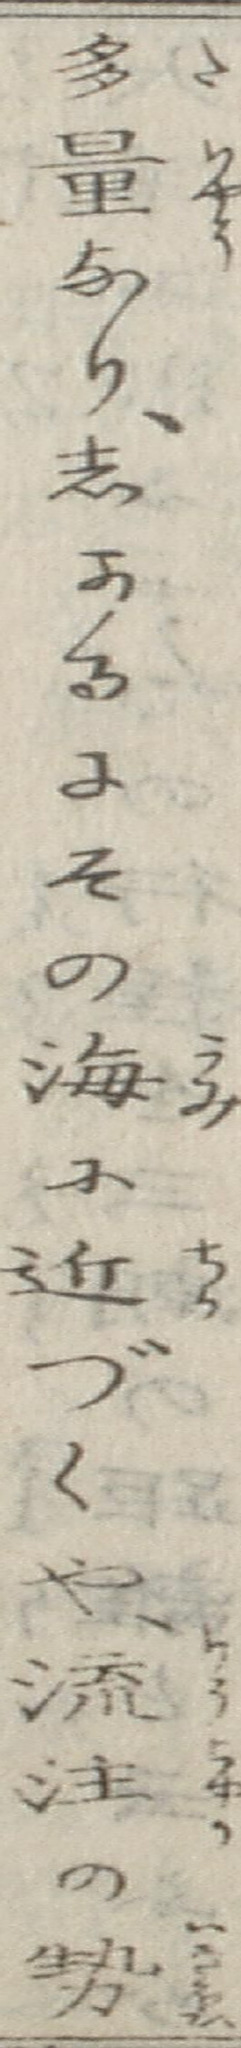多量なり、しかるにその海に近づくや、流注の勢
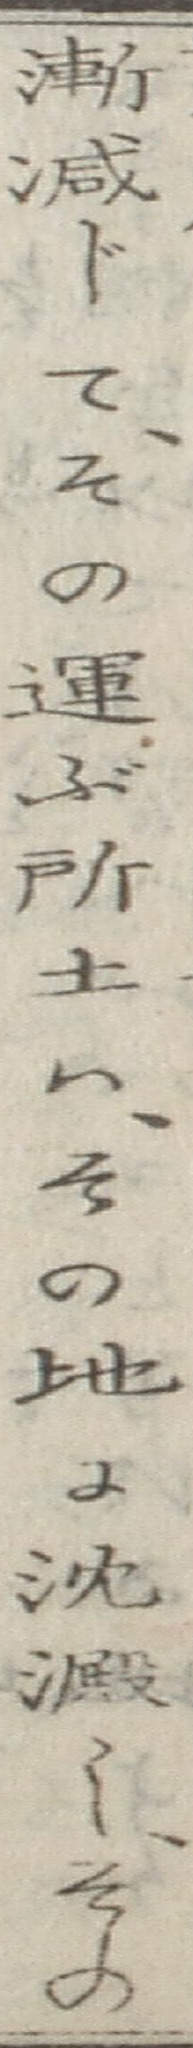漸減じて、その運ぶ所土は、その地に沈殿し、その
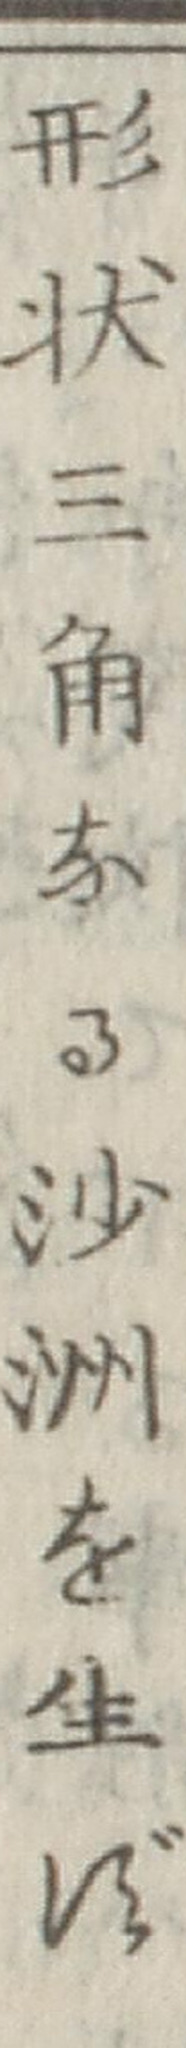形状三角なる沙洲を生ず
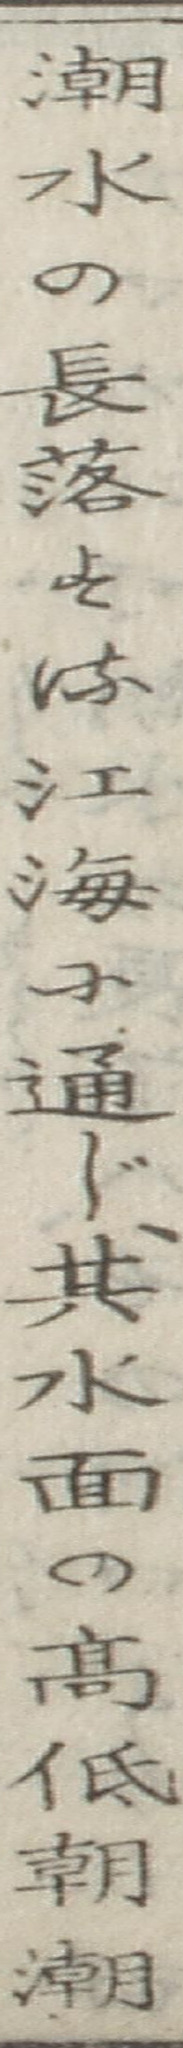潮水の長落する江海に通じ、其水面の高低朝潮
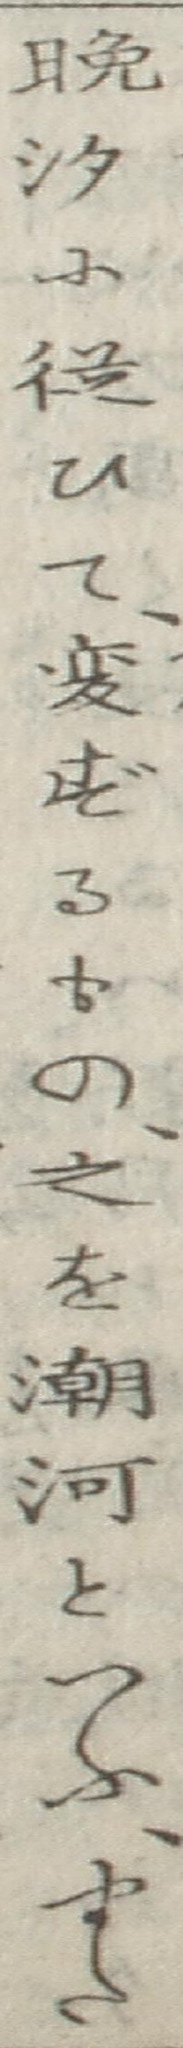晩汐に従ひて、変ずるもの、之を潮河といふ、また
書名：訓蒙　天然地理學　中
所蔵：東京大学地震研究所図書室 Earthquake Research Institute Library, The University of Tokyo, JAPAN
